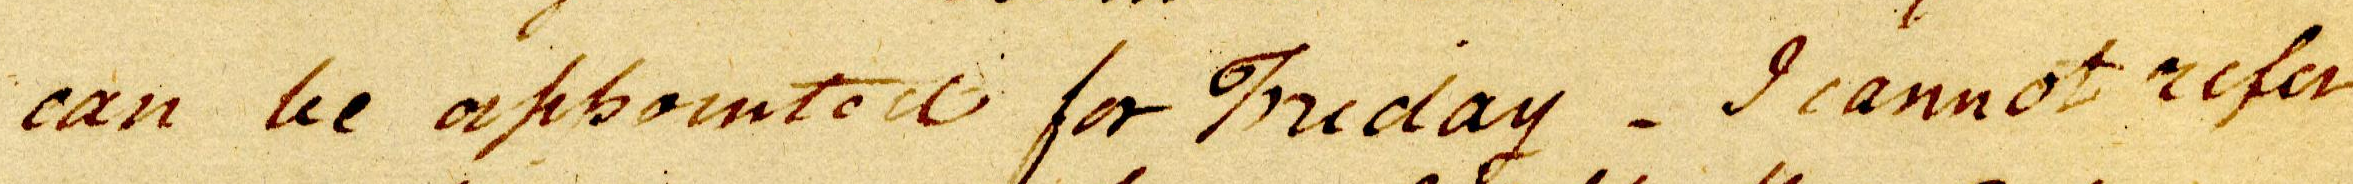can be appointed for Friday. I cannot refer
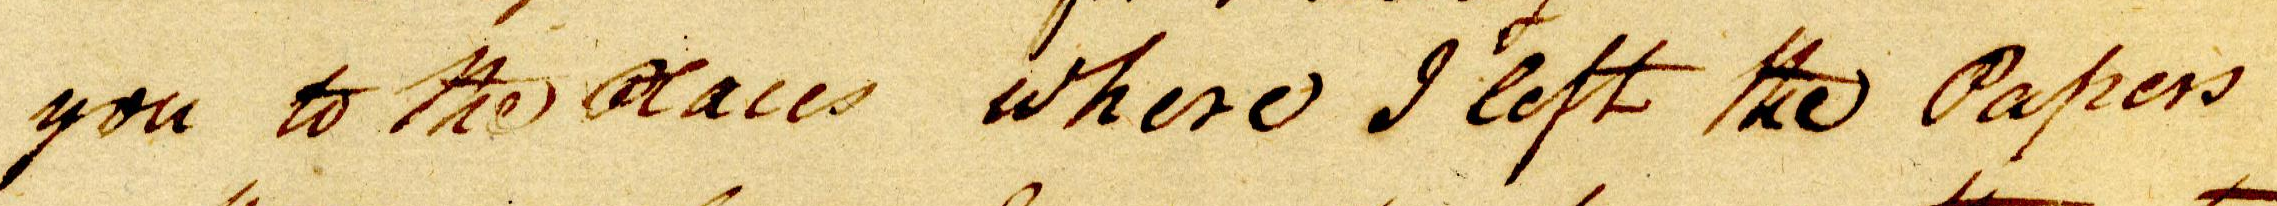you to the Places where I left the Papers
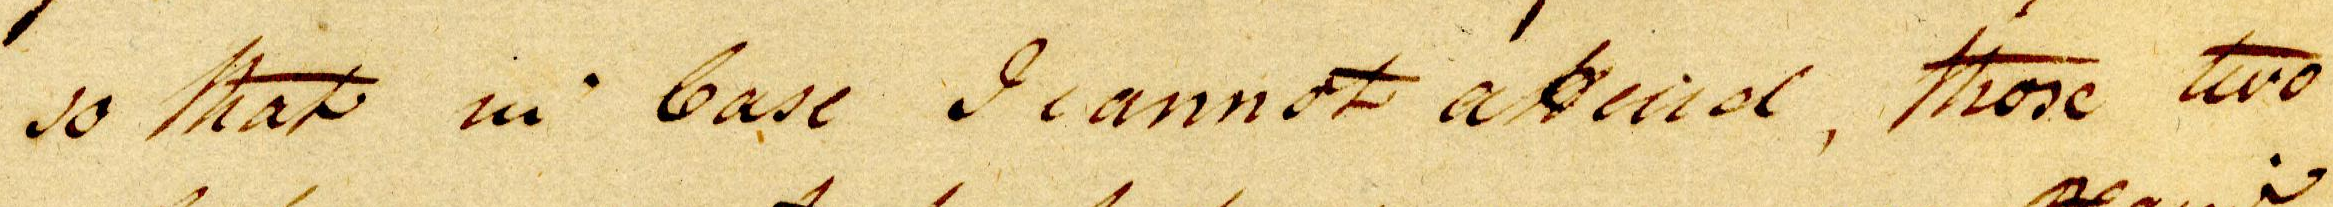so that in Case I cannot attend, those twe
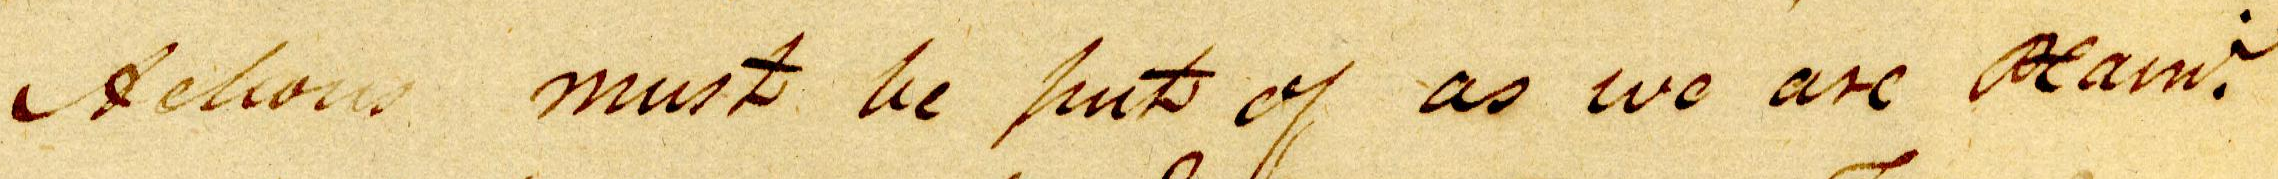Actors, must be put of as we are Plain^.
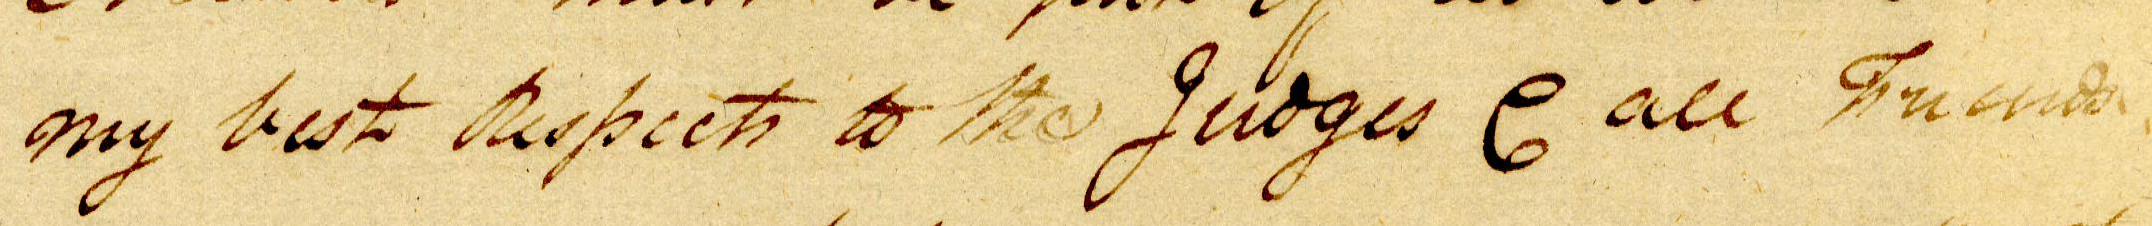my best Respects to the Judges Call Friends
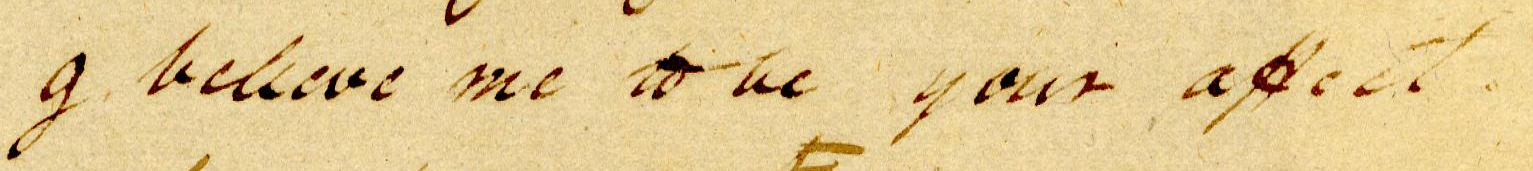I believe me to be your affect
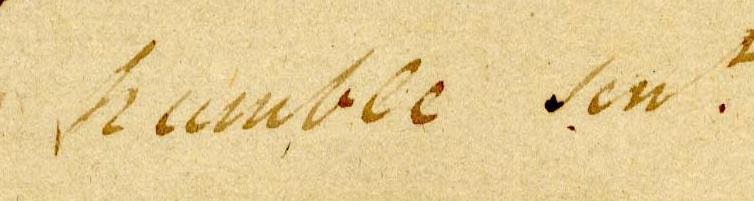humble ser^t
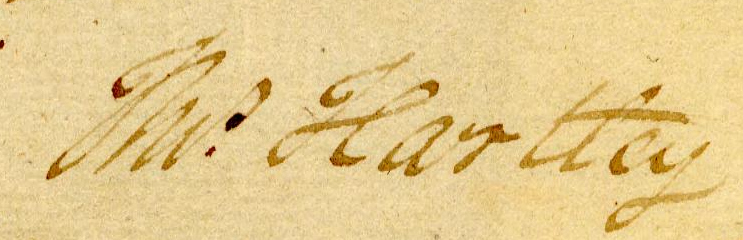Tho^s. Hartley
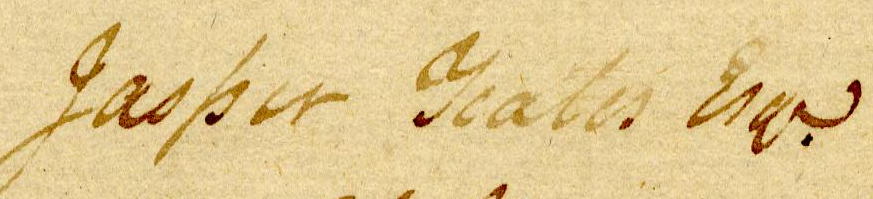Jasper Yeates Esq^r.
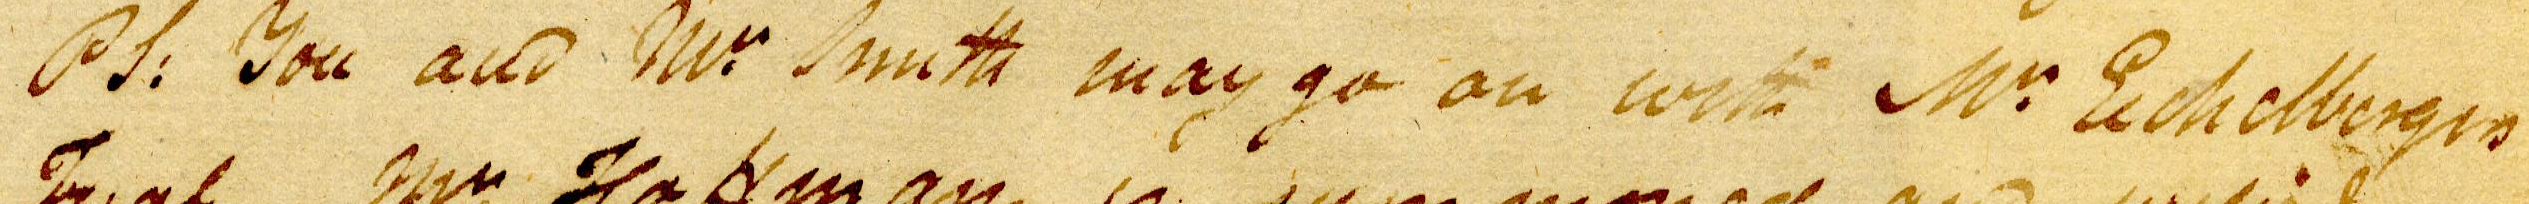PS. You and M^r. Smith may go on with M^r. Echelbergers
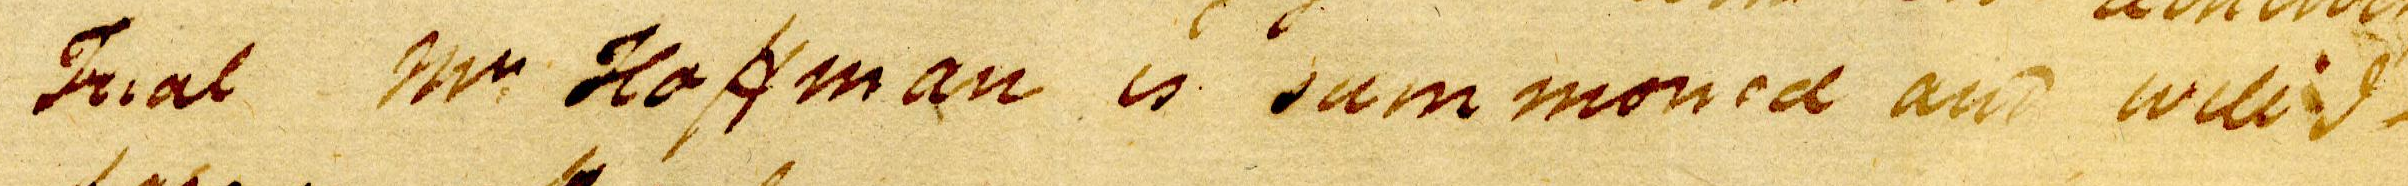Trial M^r Hoffman is summoned and will I
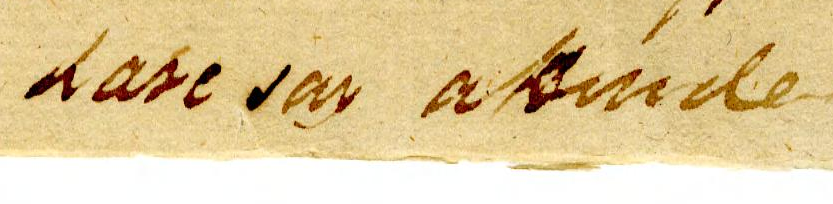dare say attend
